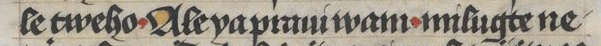le tweho.Ale ya praui wam.milugte ne¬
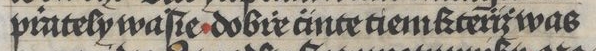pṙately waẛie.dobṙe ċinte tiem kteṙíż was
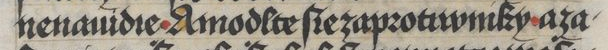nenauidie.A modlte ſie zaprotiwníky.a za¬
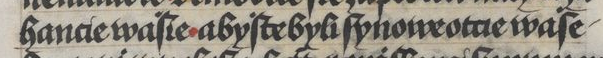hancie waẛie.abyẛte byli ſynowe otcie waẛe¬
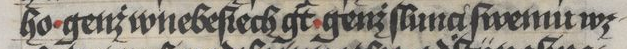ho.genż wnebeſiech ḡt.genż ſlunci ſwemu wz¬
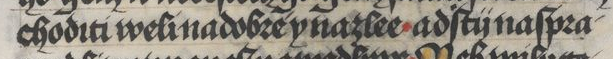choditi weli nadobre y na zlee.adẛtij naſpra¬
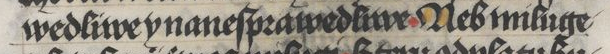wedliwe y a na neſprawedliwe.Neb miluge¬
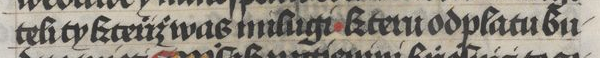teli ty kteṙiż was milugí.kteru odplatu bu¬
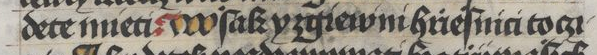dete míeti?Wẛak y zgiewní hṙieſníci to czi¬
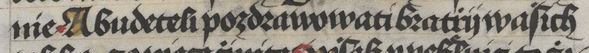níe.A budeteli pozdrawowati bratṙij waẛich
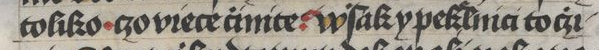toliko.czo víece ċíníte?wẛak y peklníci to cżi¬
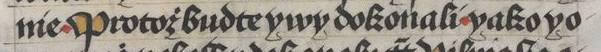níe.Protoż budte y wy dokonalí.gako yo¬
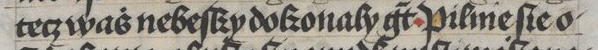tecz waṡ nebeſky dokonaly ḡt.Pilnie ſie o¬
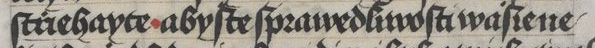ſtṙiehayte.abyẛte ſprawedliwoſti waẛie ne¬
